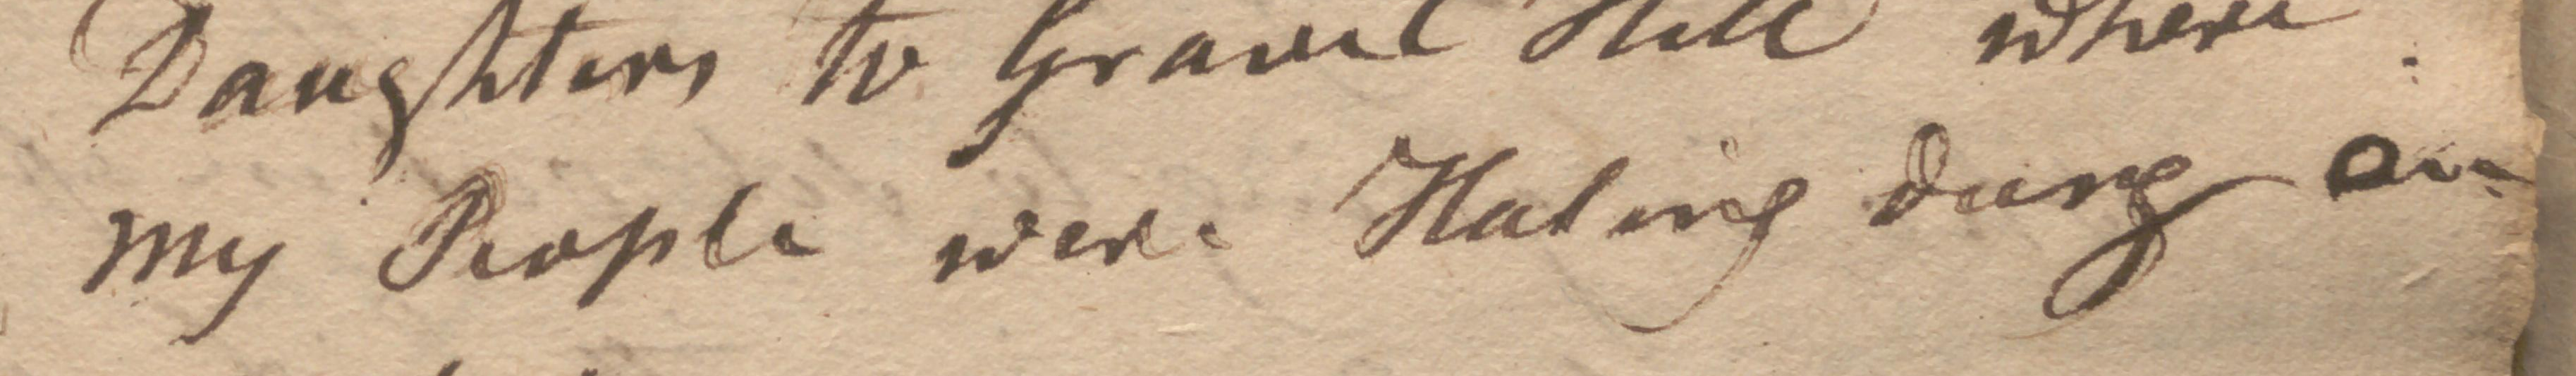My People were Haling dung on
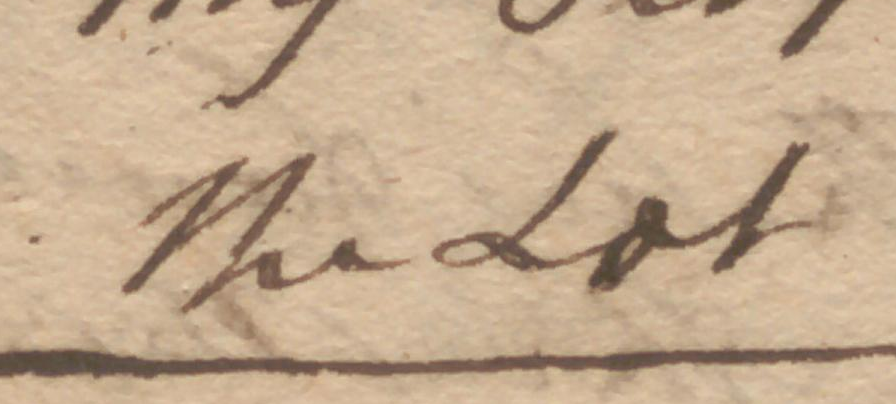the Lot
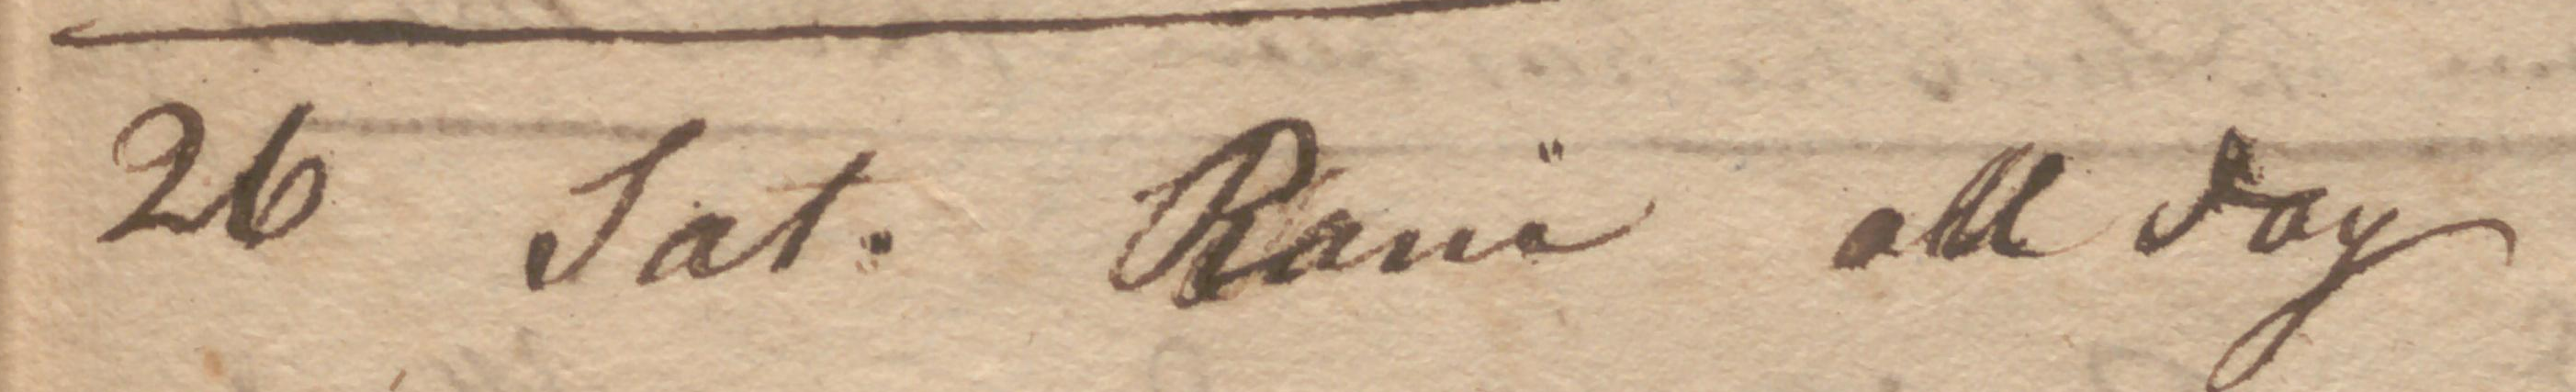26 Sat. Rain all day
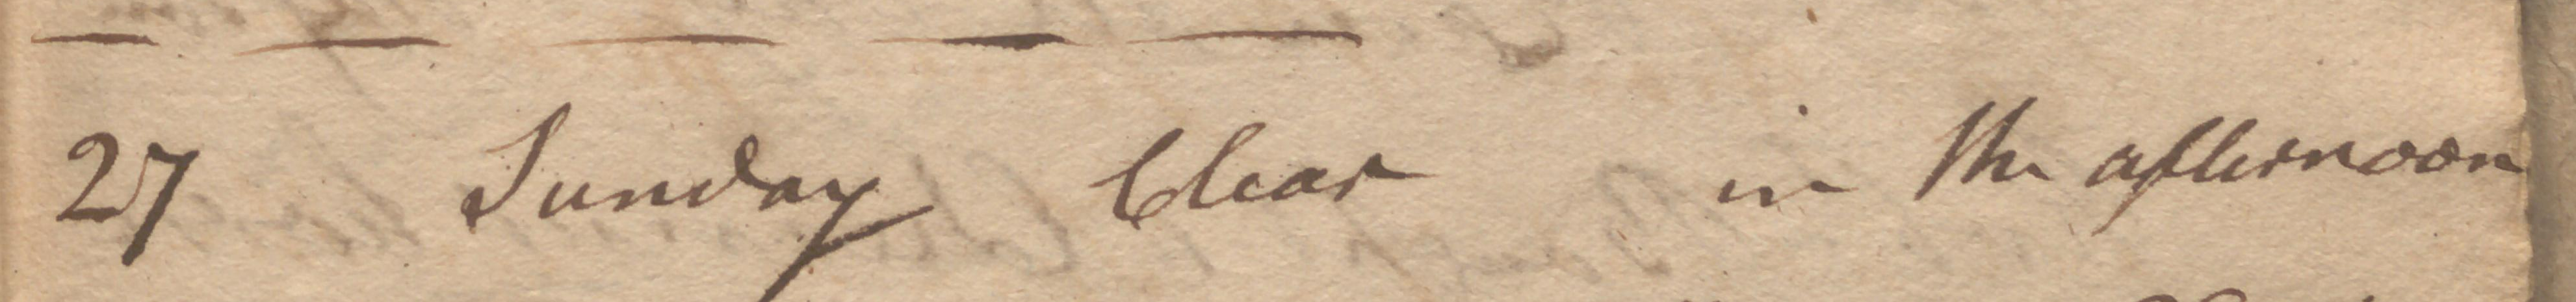27 Sunday Clear in the afternoon
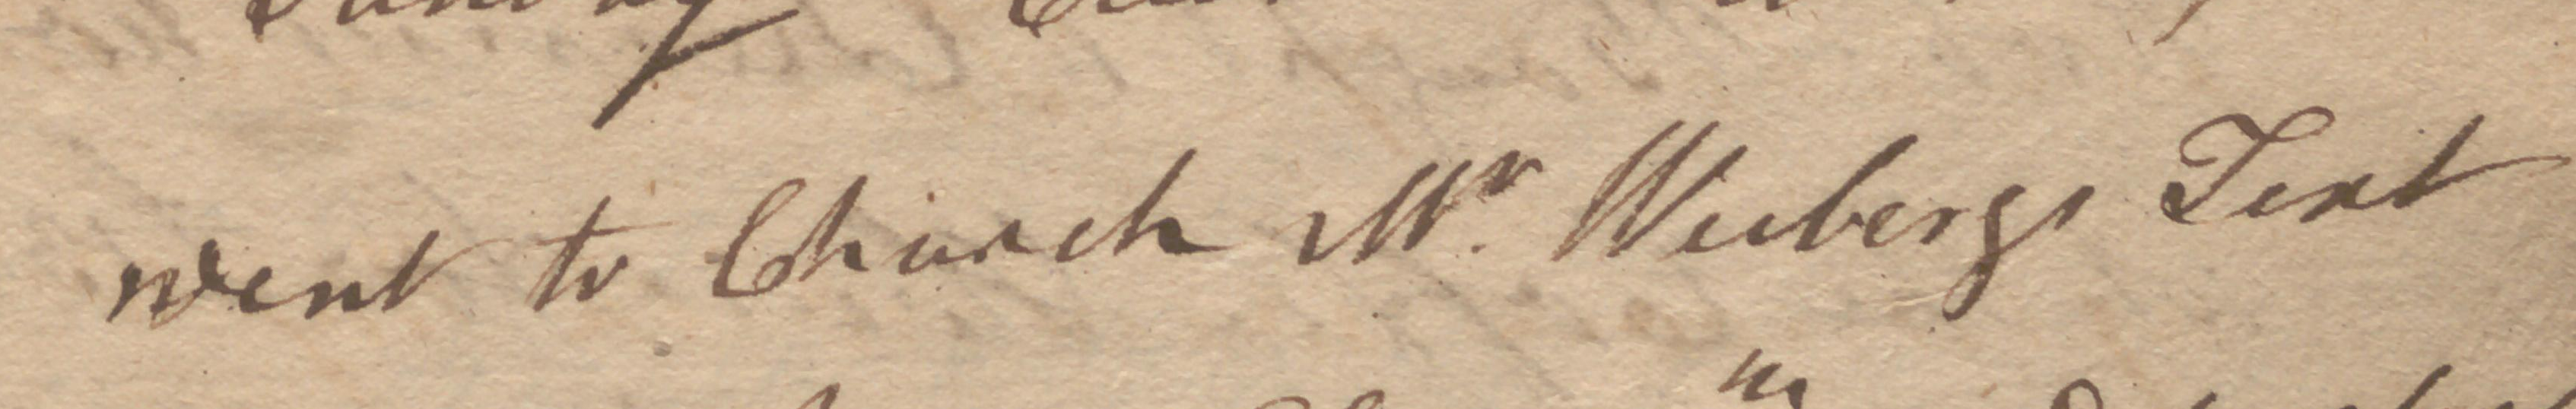went to Church M^r. Weibergs Text
